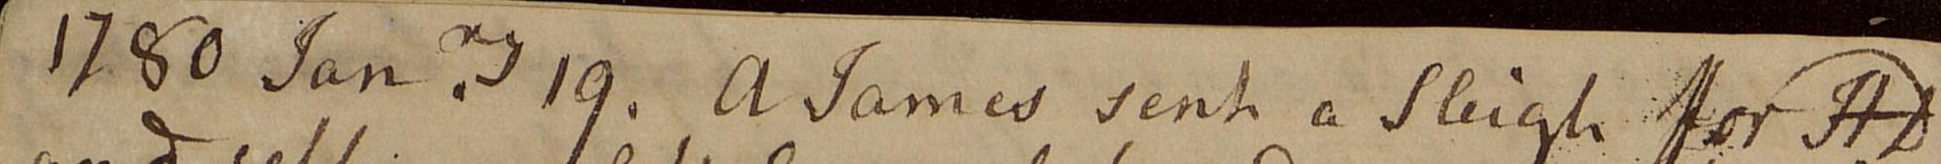1780 Jan^ry. 19. A James sent a sleigh for HD
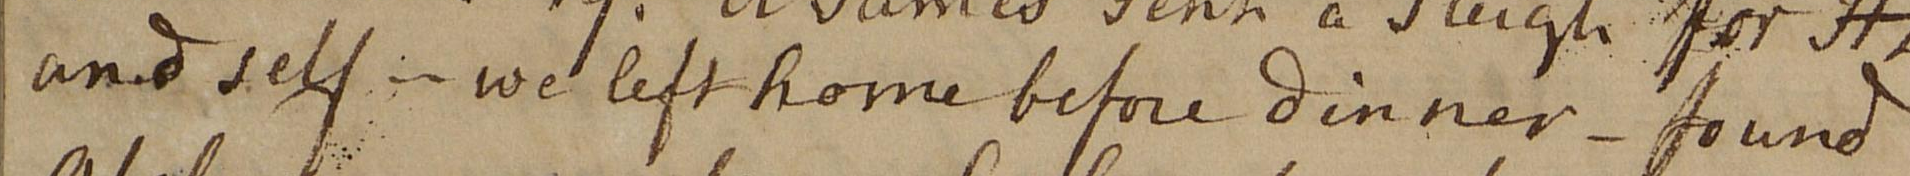and self- we left home before dinner- found
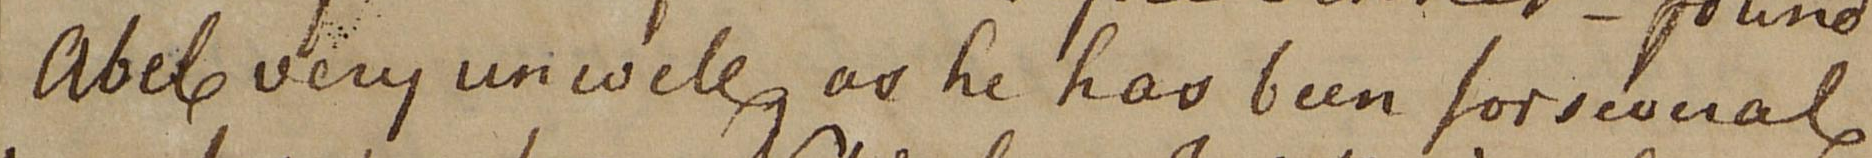Abel very unwell, as he has been for several
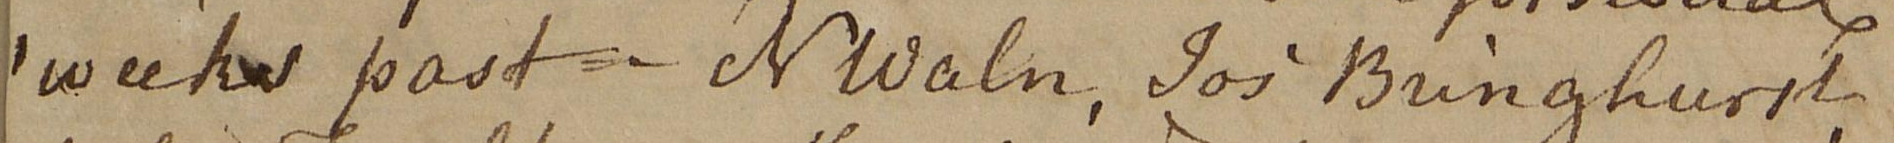weeks past- N Waln, Jos' Bringhurst
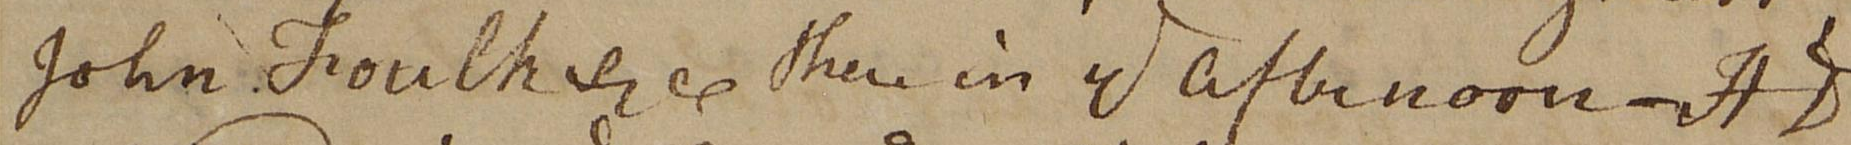John Foulk &c there in y^e Afternoon- HD
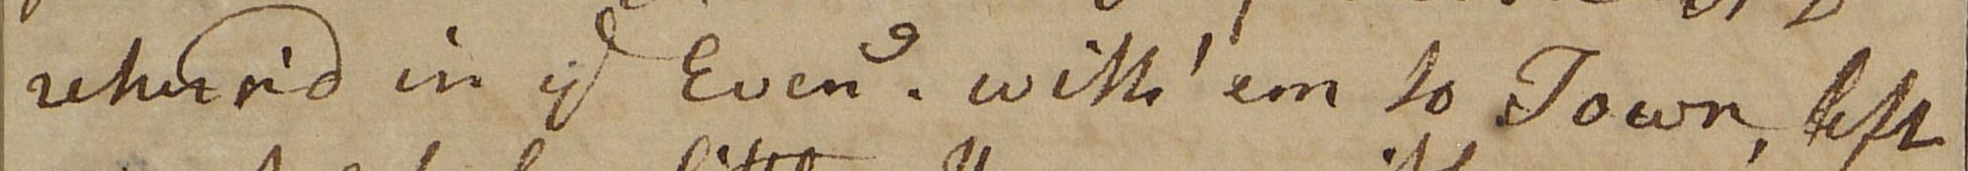return'd in y^e Even^g. with 'em to Town, left
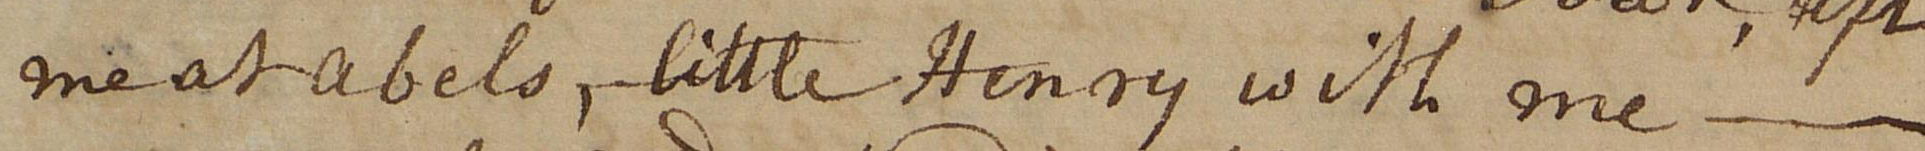me at Abels, little Henry with me-
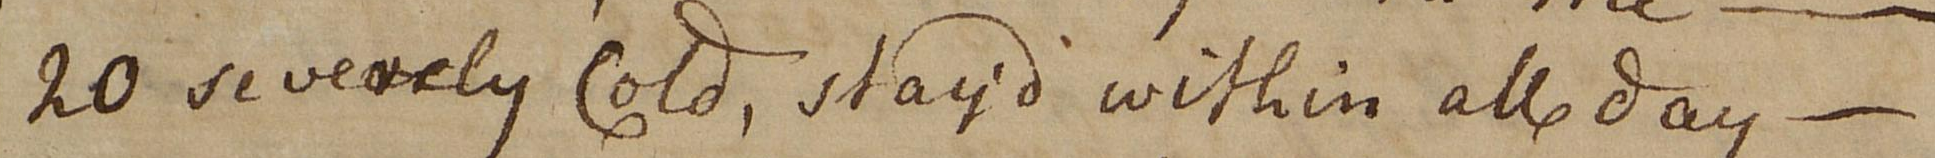20 severely Cold, stay'd within all day-
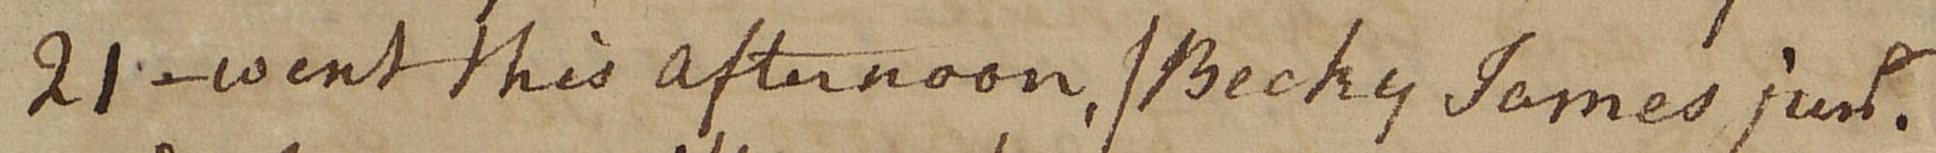2I- went this afternoon, /Becky James jun^r.
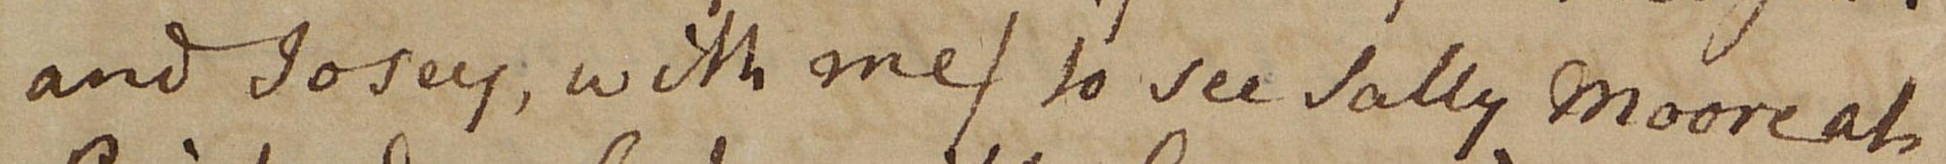and Josey, with me/ to see Sally Moore at
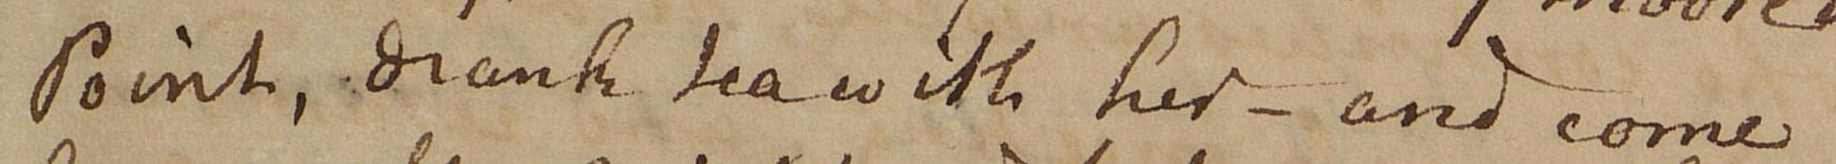Point, drank tea with her- and come
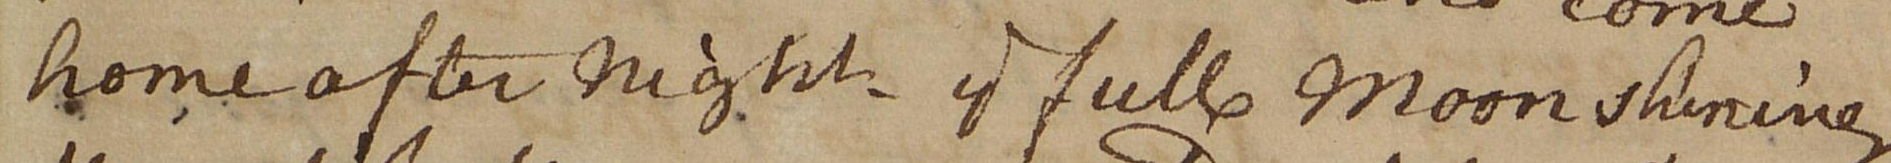home after night- y^e full Moon shining
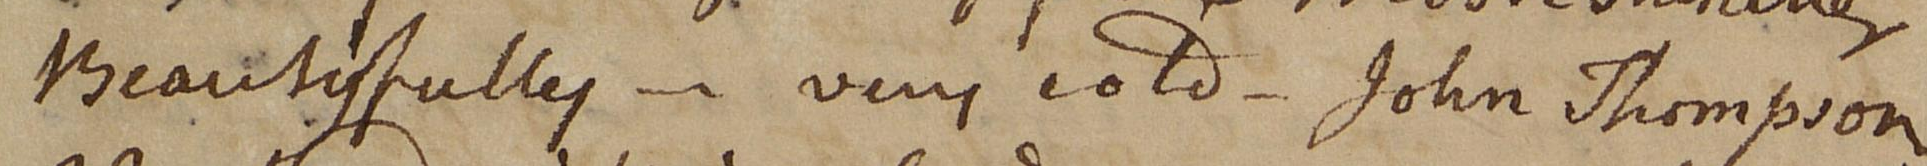Beautyfully- very cold- John Thompson,
